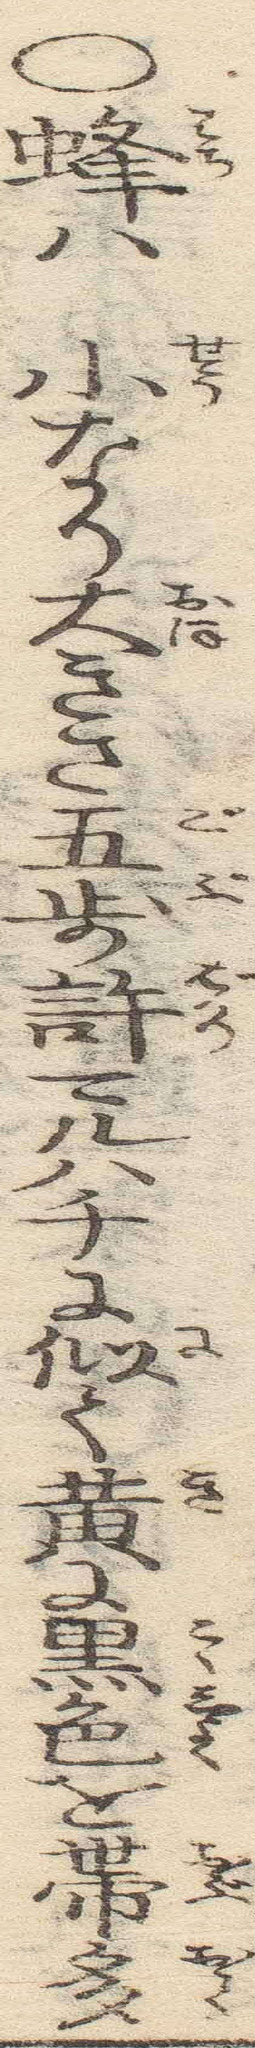○蜂は小なり大きさ五歩許マルハチに似て黄に黒色を帯多
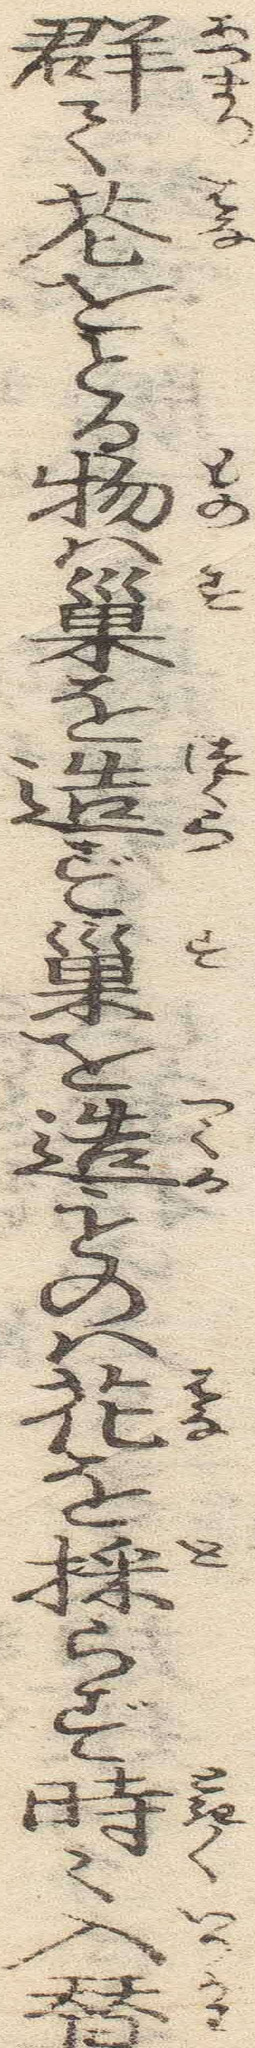群て花をとる物は巣を造ず巣を造ものは花を採らず時々入替
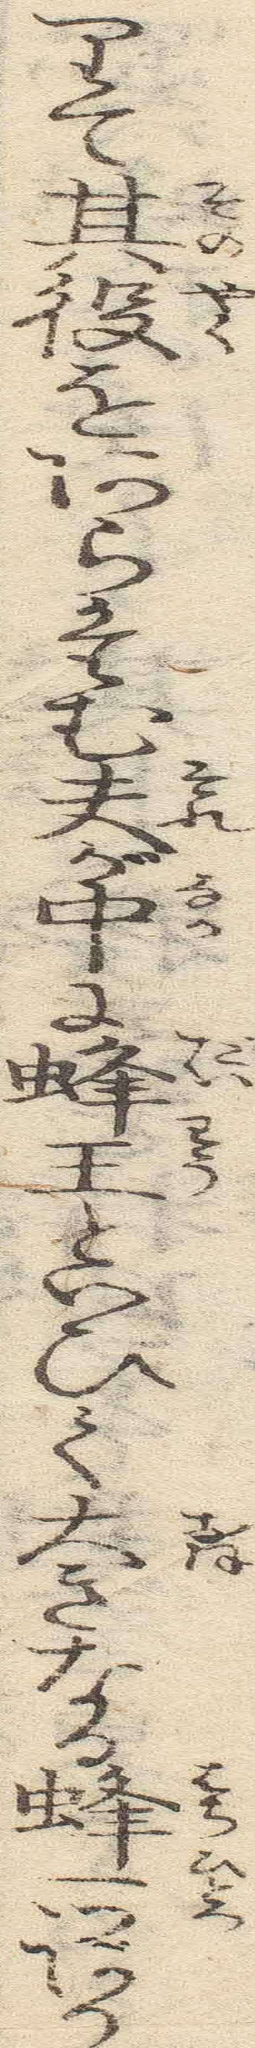りて其役をあらたむ夫が中に蜂王といひて大きなる蜂一つあり
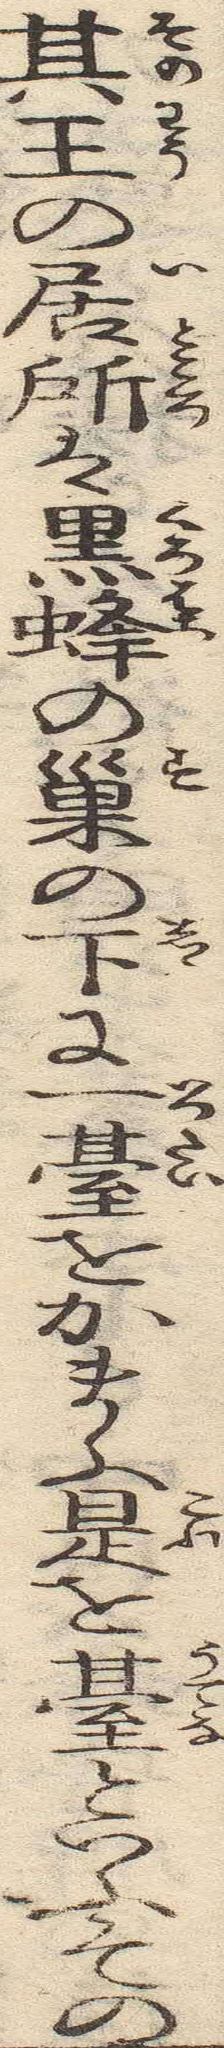其王の居所は黒蜂の巣の下に一台をかまふ是を台といふその
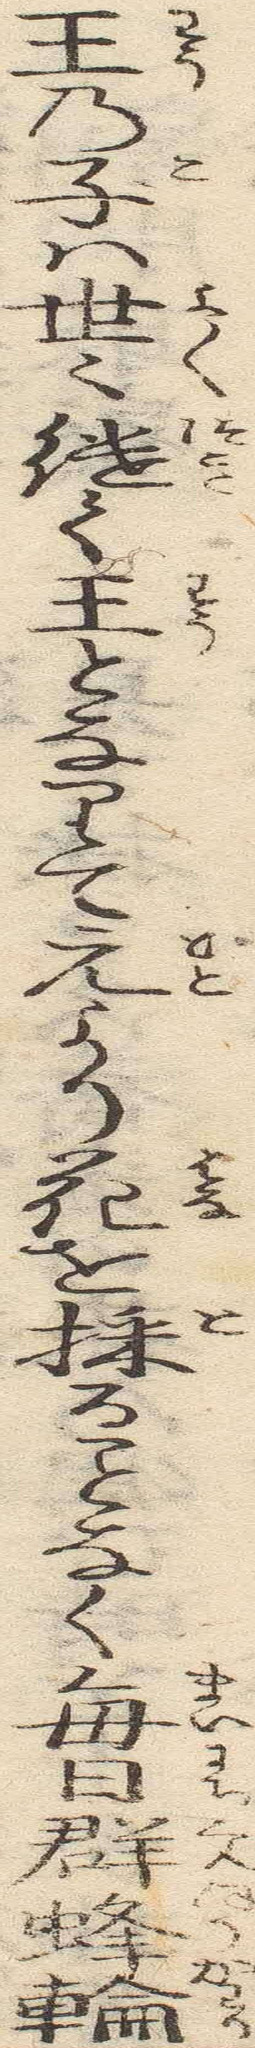王の子は世々継て王となりて元より花を採ることなく毎日群蜂輪
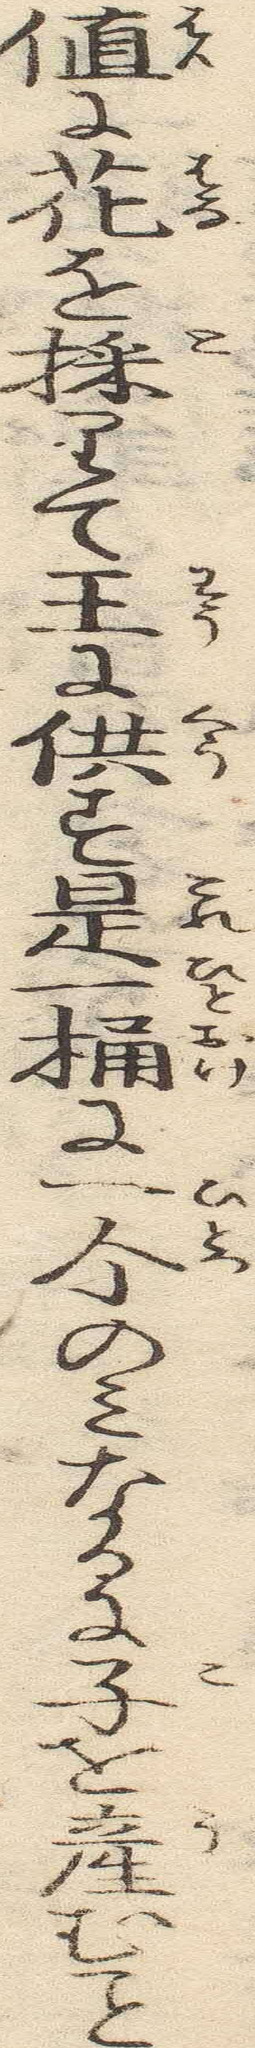値に花を採りて王に供す是一桶に一个のみなるに子を産むこと
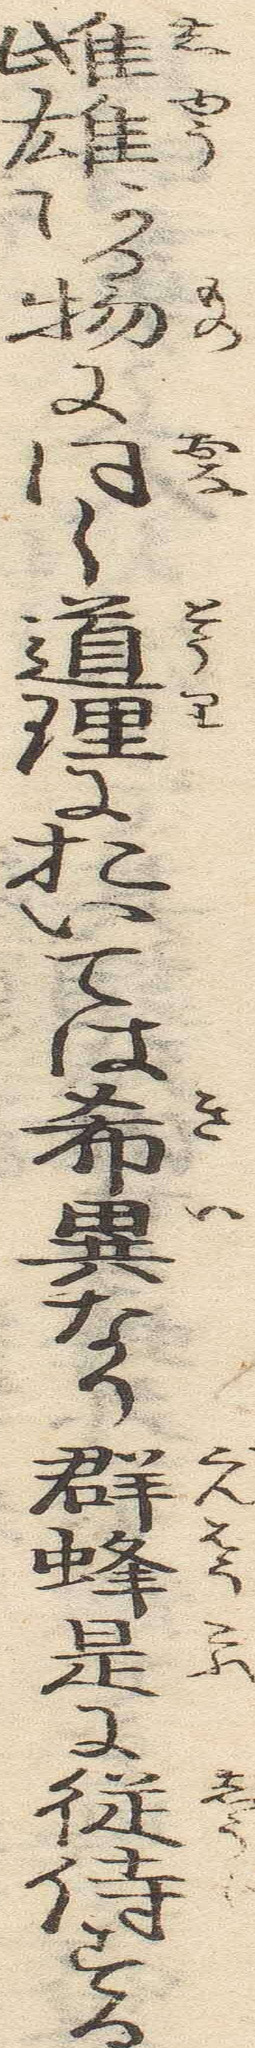雌雄ある物に同し道理においては希異なり群蜂是に従侍する
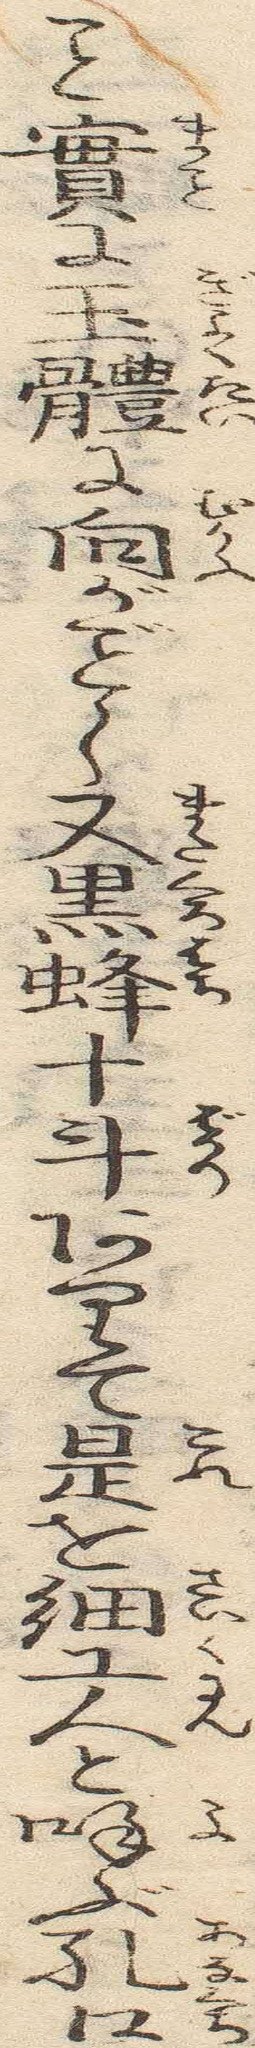こと実に玉体に向がごとし又黒蜂十斗ありて是を細工人と呼ぶ孔口
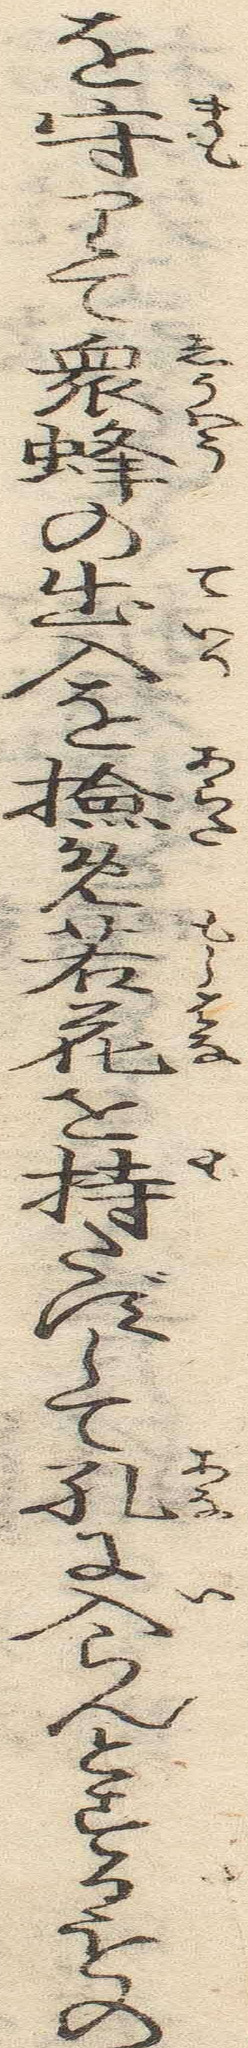を守りて衆蜂の出入を検め若花を持たずして孔に入らんとするもの
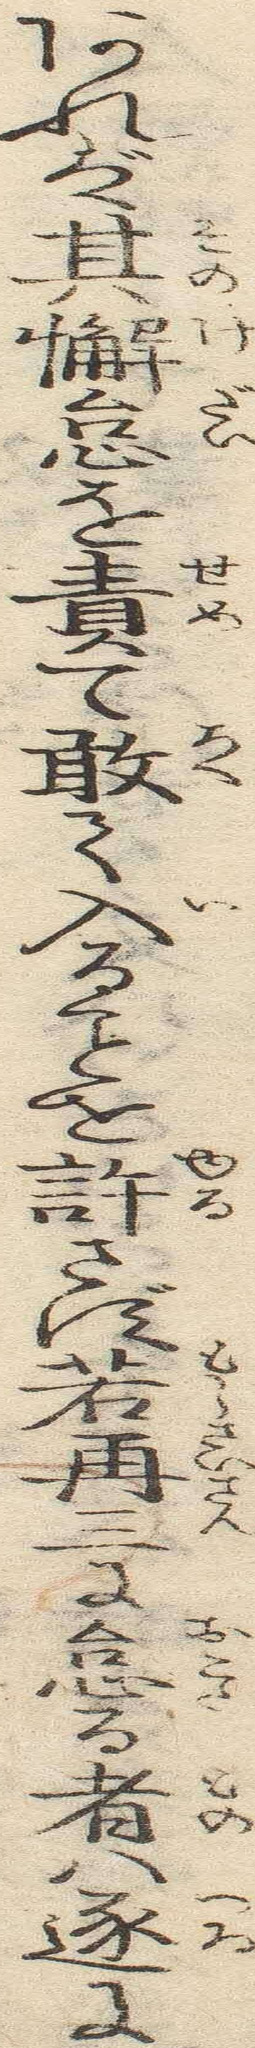あれば其懈怠を責て敢て入ることを許さず若再三に怠る者は遂に
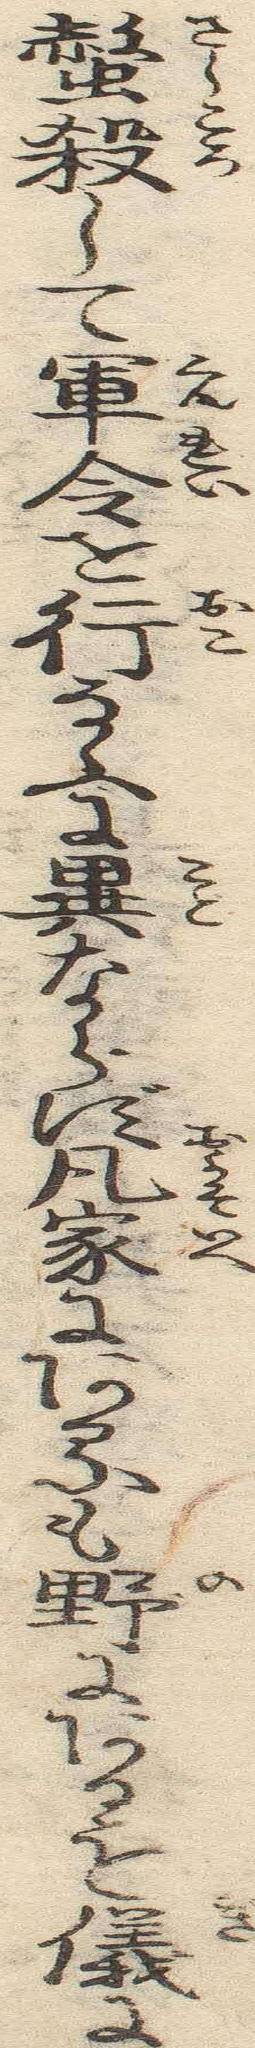螫殺して軍令を行なふに異ならず凡家にあるも野にあるも儀に
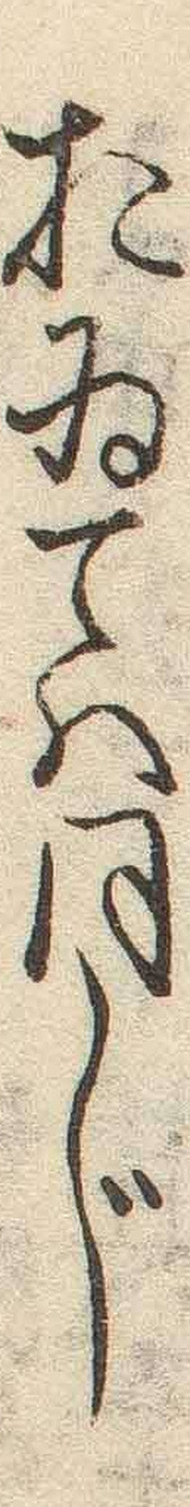おゐては同じ
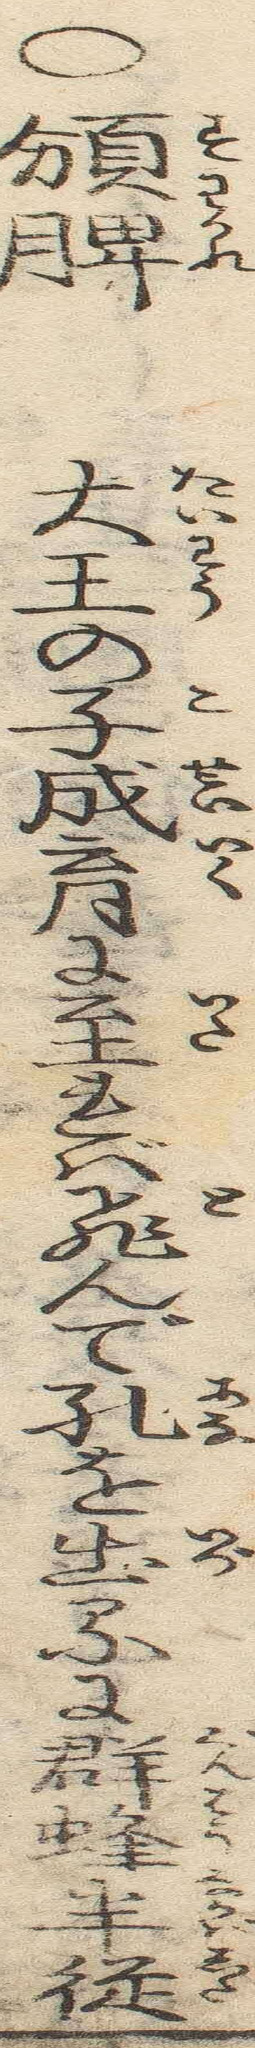○頒脾大王の子成育に至れば飛んで孔を出るに群蜂半従
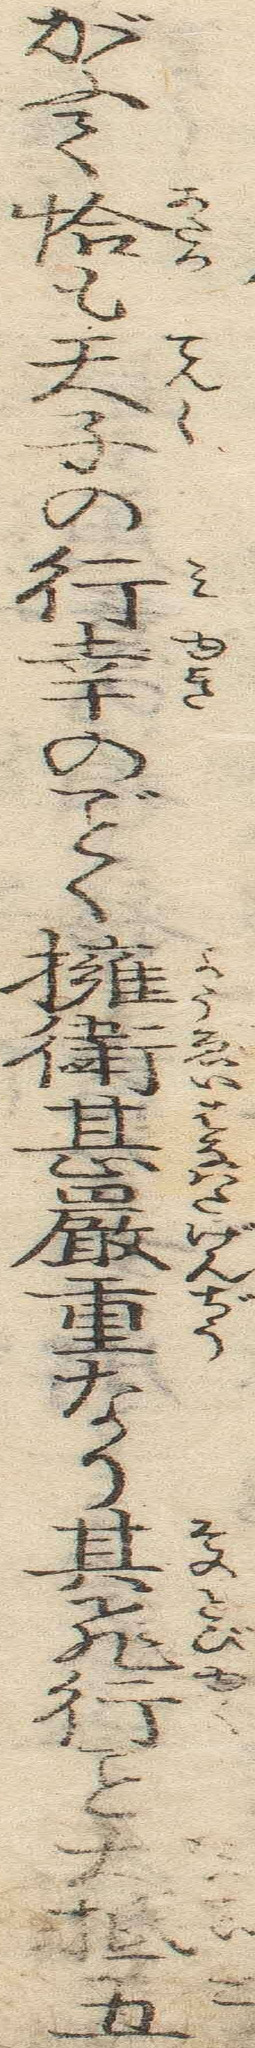がふて恰も天子の行幸のごとく擁衛甚厳重なり其飛行こと大抵五
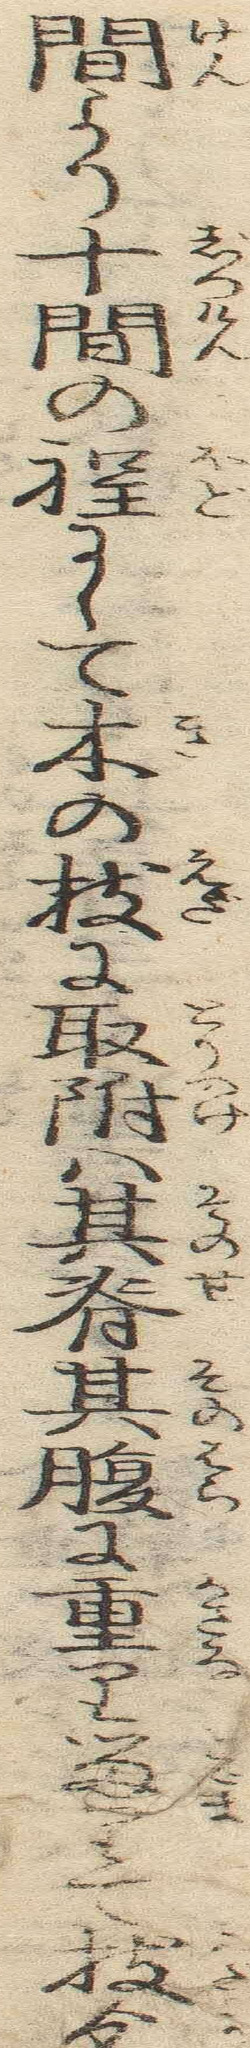間より十間の程にして木の枝に取附は其脊其腹に重り留りて枝ゟ
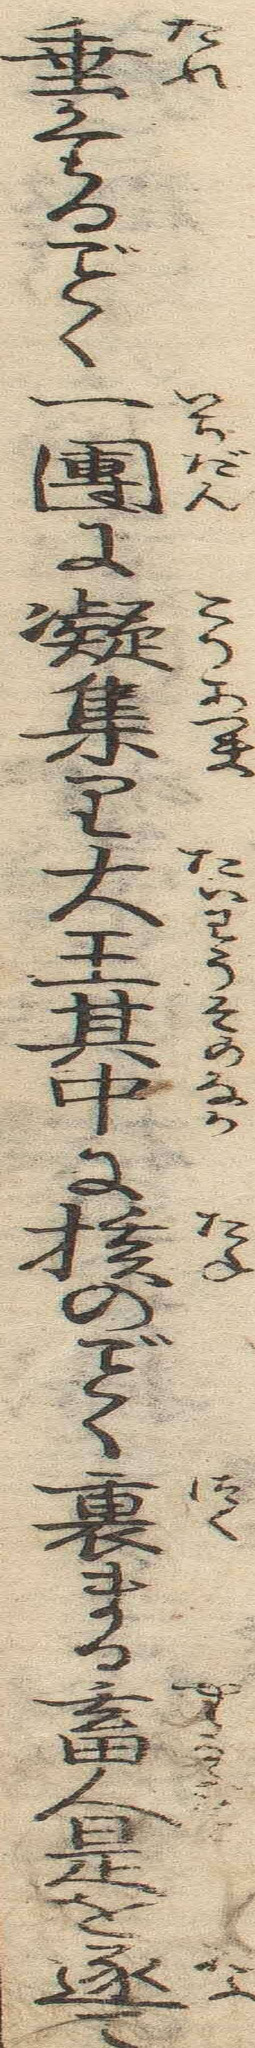垂たるごとく一団に凝集り大王其中に核のごとく裏まる畜人是を逐て
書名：日本山海名産図会
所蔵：東京学芸大学附属図書館 国文学研究資料館
